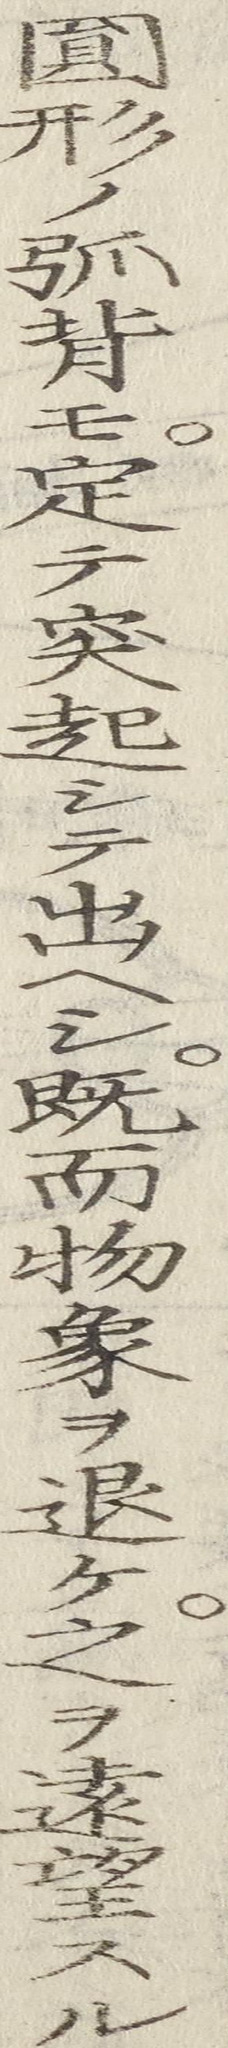円形ノ弧背モ。定テ突起シテ出ヘシ。既而物象ヲ退ケ。之ヲ遠望スル
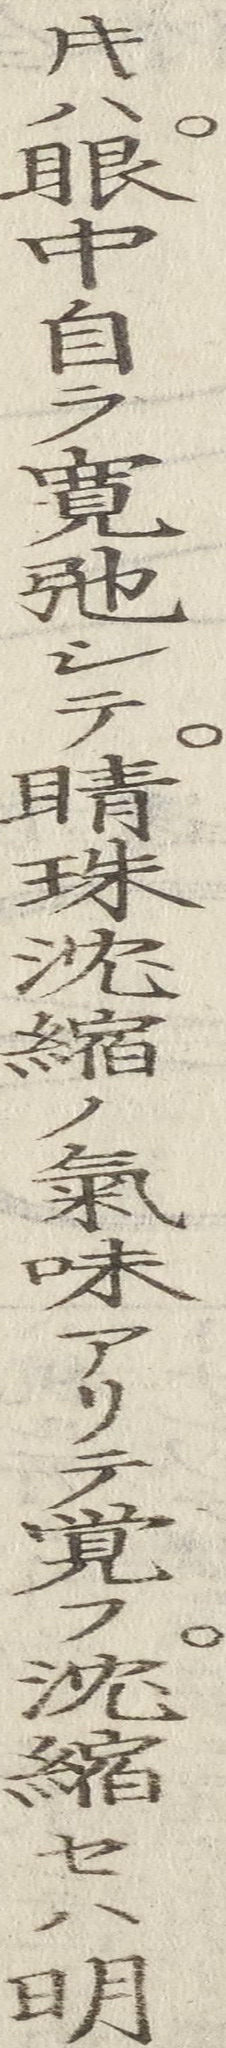トキハ。眼中自ラ寛弛シテ。睛珠沈縮ノ気味アリテ覚フ。沈縮セハ明
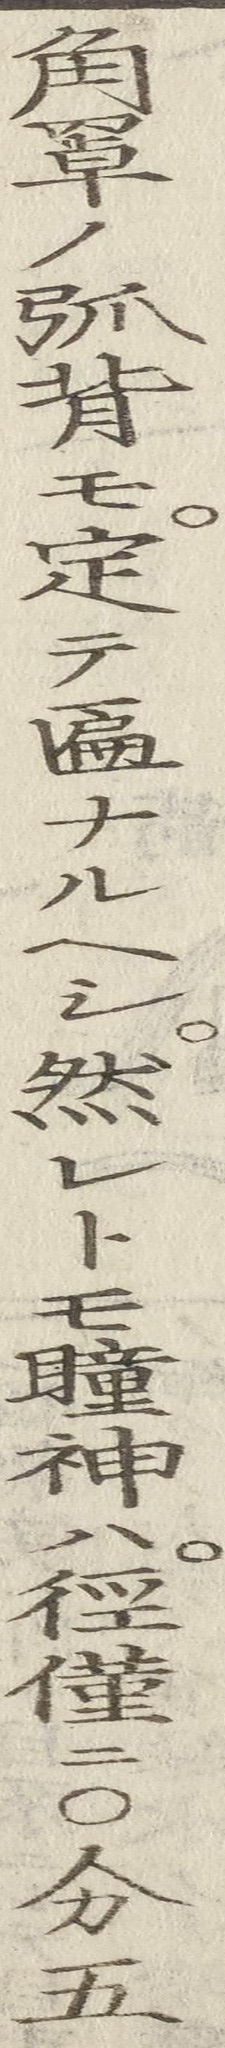角罩ノ弧背モ。定テ匾ナルヘシ。然レトモ瞳神ハ。径僅ニ〇分五
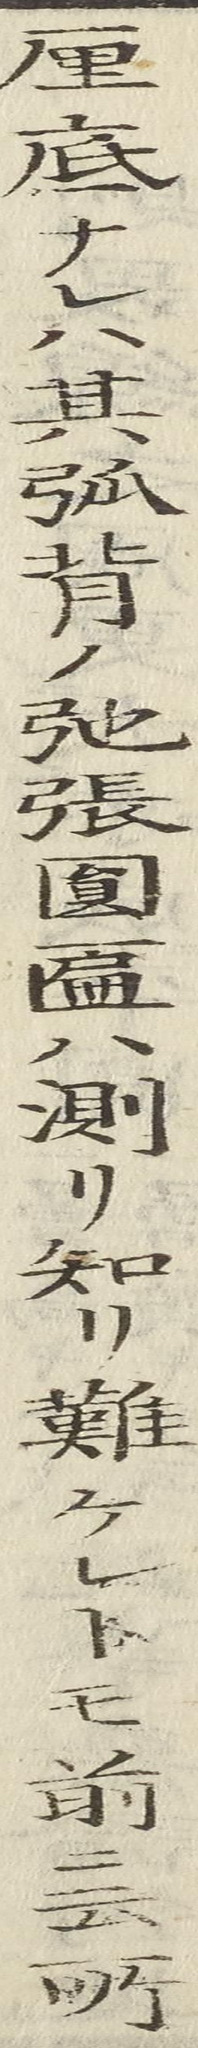厘底ナレハ其弧背ノ弛張円匾ハ測リ知リ難ケレトモ前ニ云所
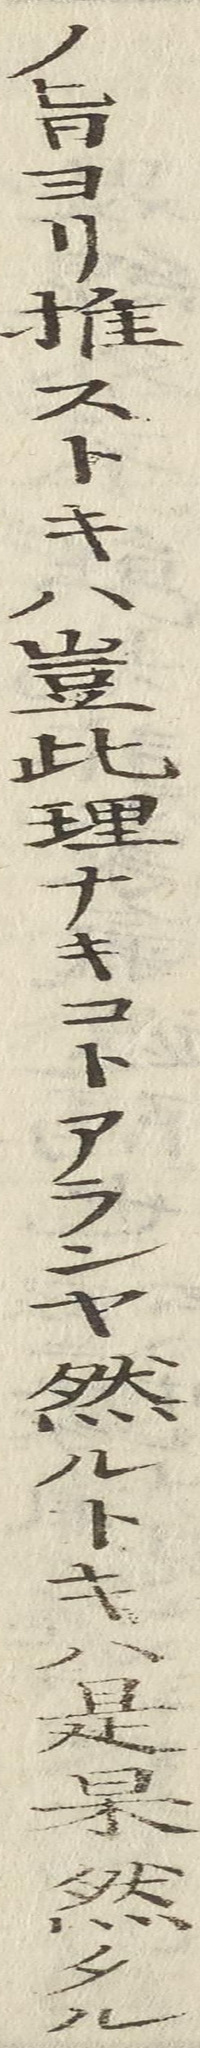ノ旨ヨリ推ストキハ豈此理ナキコトアランヤ然ルトキハ是杲然タル
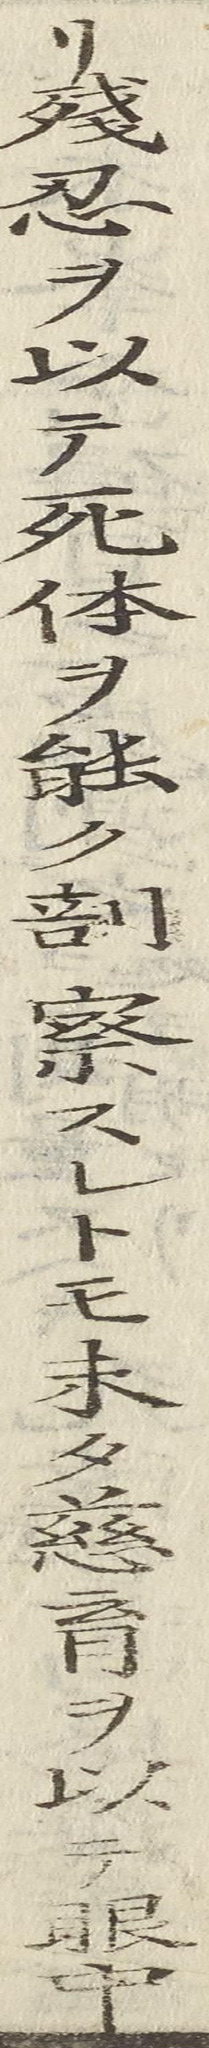リ残忍ヲ以テ死体ヲ能ク剖察スレトモ未タ慈育ヲ以テ眼中
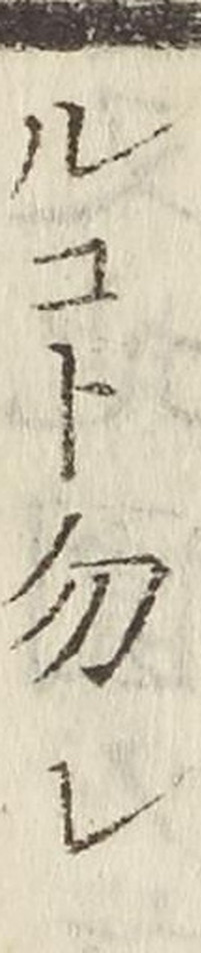ルコト勿レ
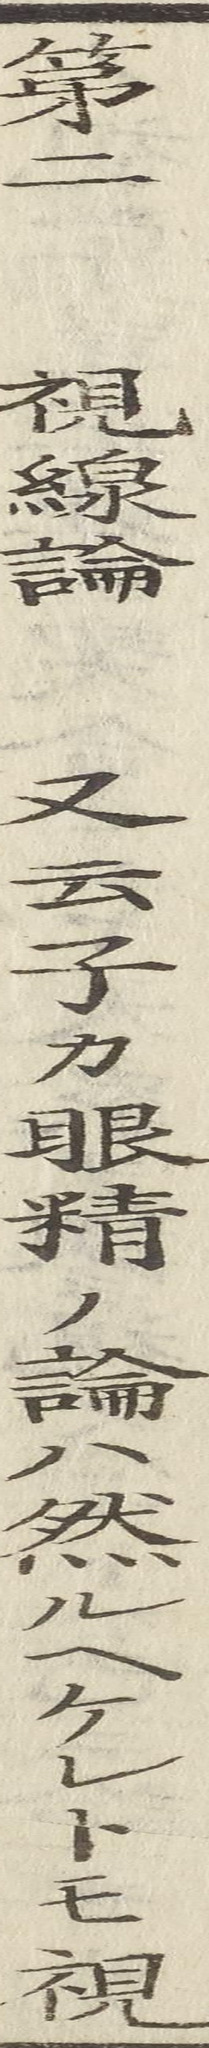第二視線論又云子カ眼精ノ論ハ然ルヘケレトモ視
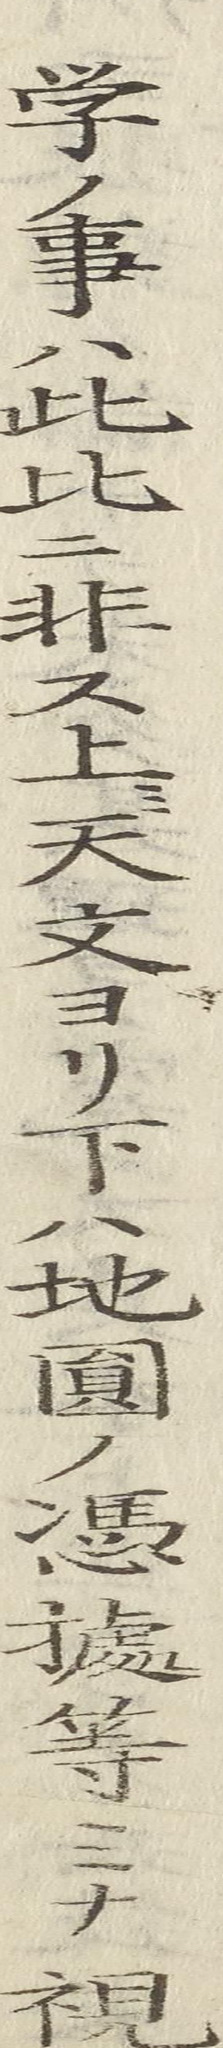学ノ事ハ此比ニ非ス上天文ヨリ下ハ地円ノ憑拠等ミナ視
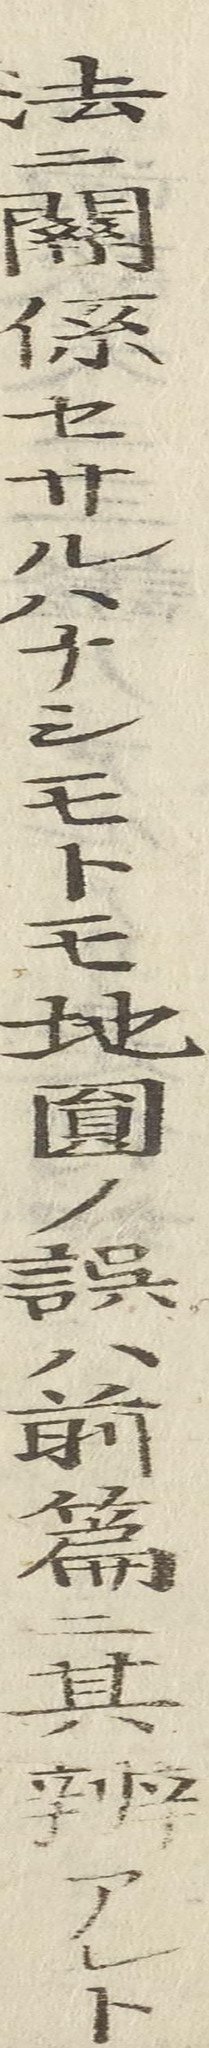法ニ関係セサルハナシモトモ地円ノ誤ハ前篇ニ其弁アレト

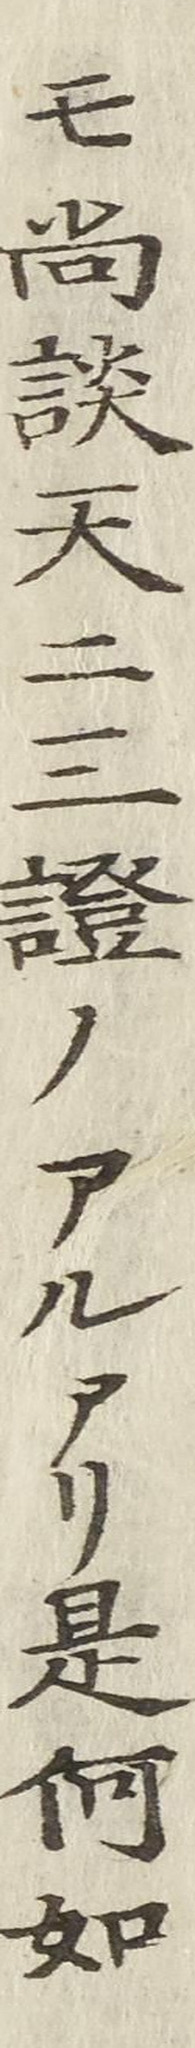モ尚談天ニ三証ノアルアリ是如何
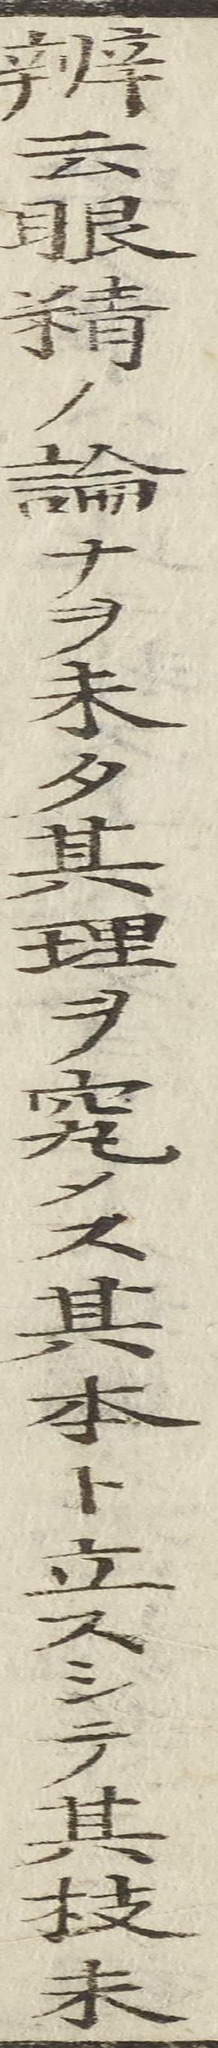弁云眼精ノ論ナヲ未タ其理ヲ究メス其本ト立スシテ其枝末
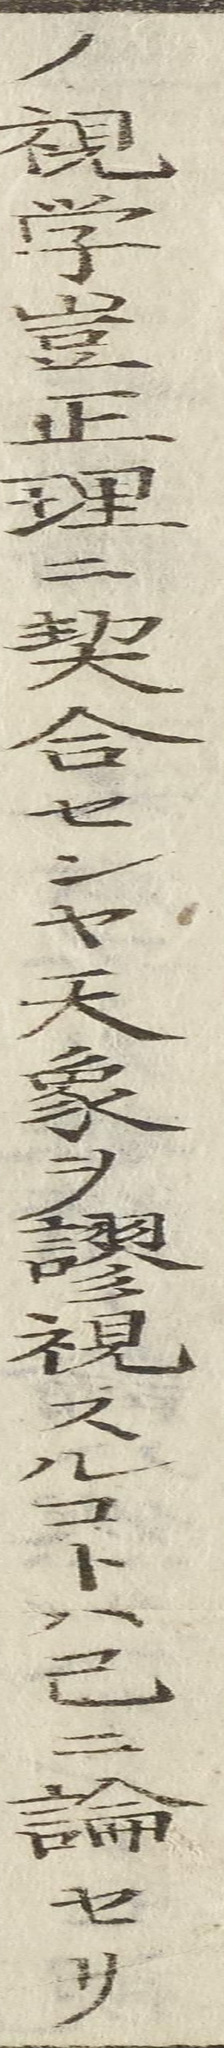ノ視学豈正理ニ契合センヤ天象ヲ謬視スルコトハ已ニ論セリ
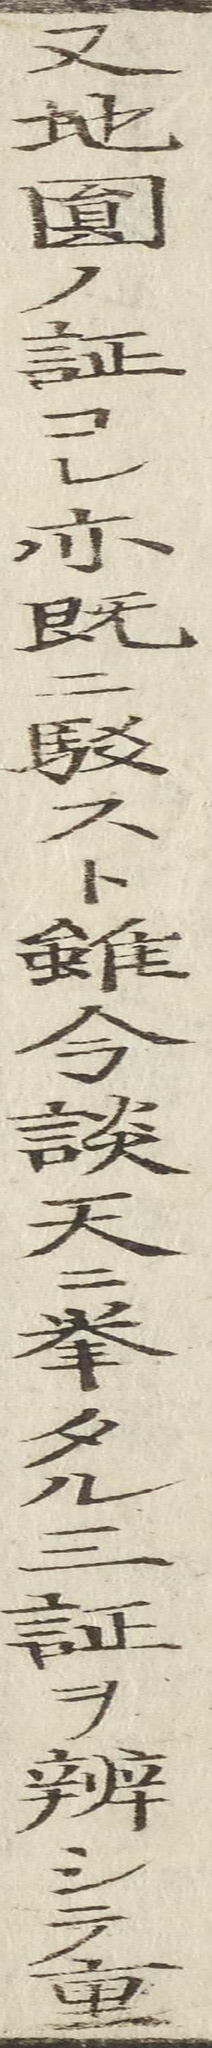又地円ノ証コレ亦既ニ駁スト雖今談天ニ挙タル三証ヲ弁シテ重
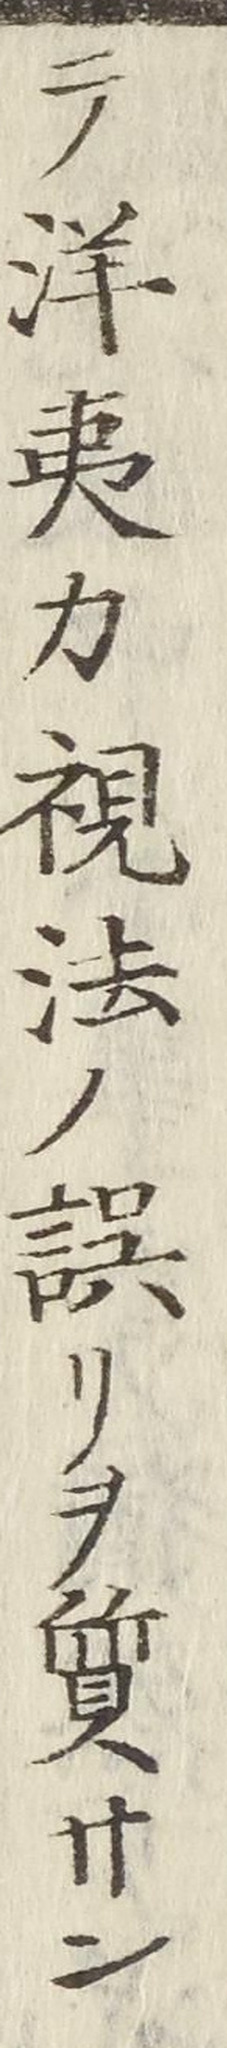テ洋夷カ視法ノ誤リヲ質サン
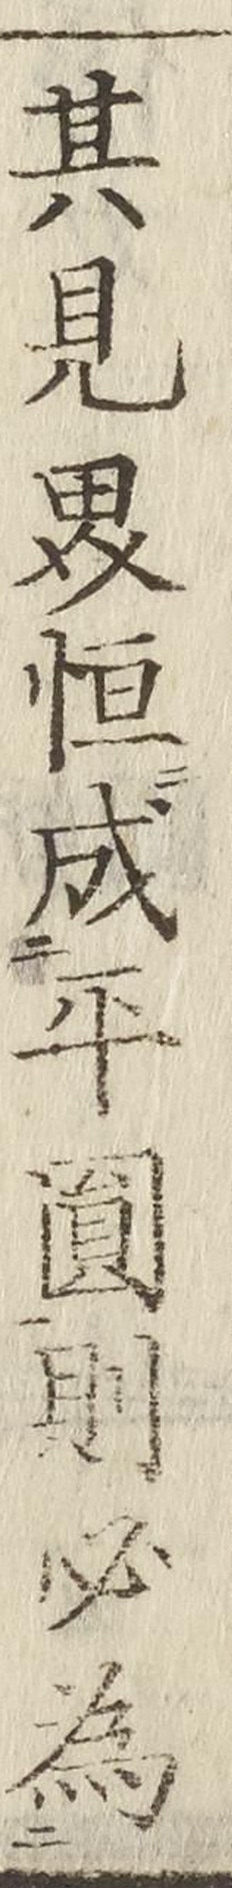其見界恒成ニ平円則必為ニ
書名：護法新論　二編　下
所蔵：東京大学地震研究所図書室 Earthquake Research Institute Library, The University of Tokyo, JAPAN
